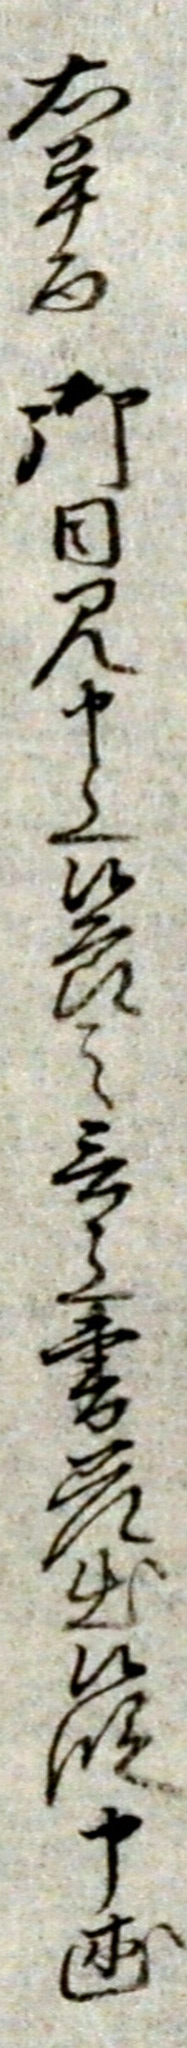右畢而御目見申上候節之言上書差出候段申述
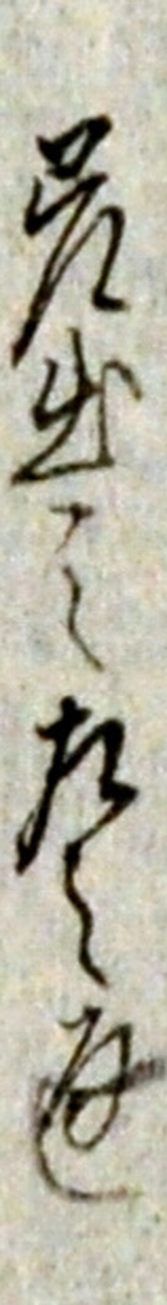差出者左之通
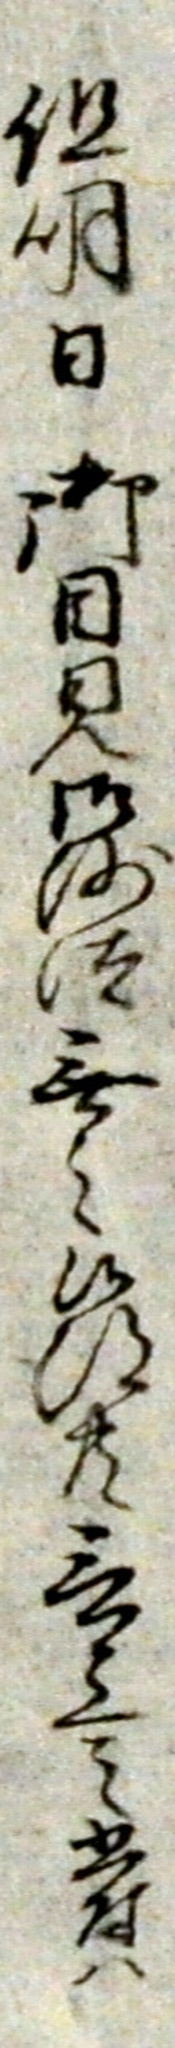但明日御目見御沙汰無之候得共言上之書付ハ
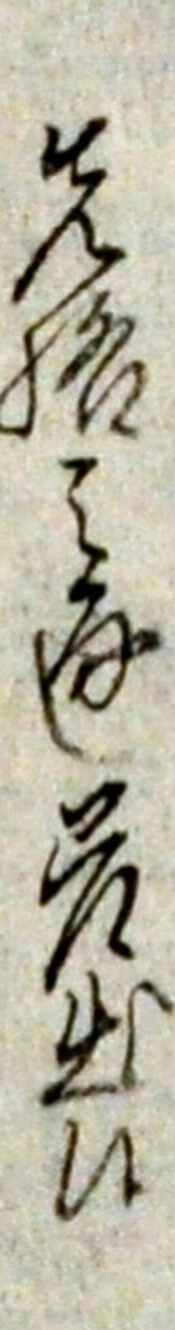先格之差出候
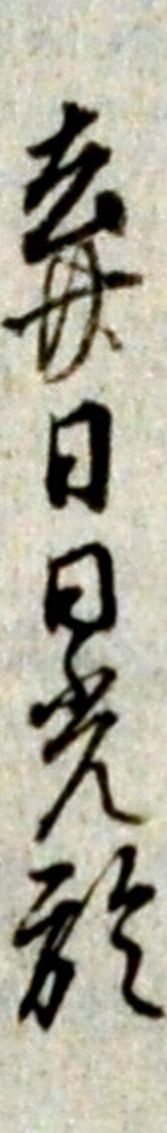去廿日光於
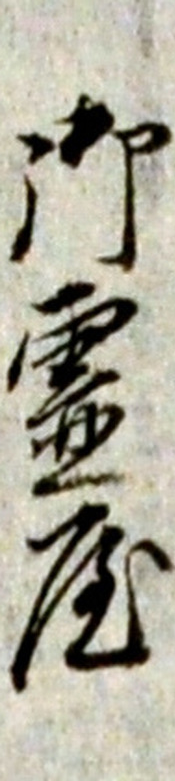御霊屋
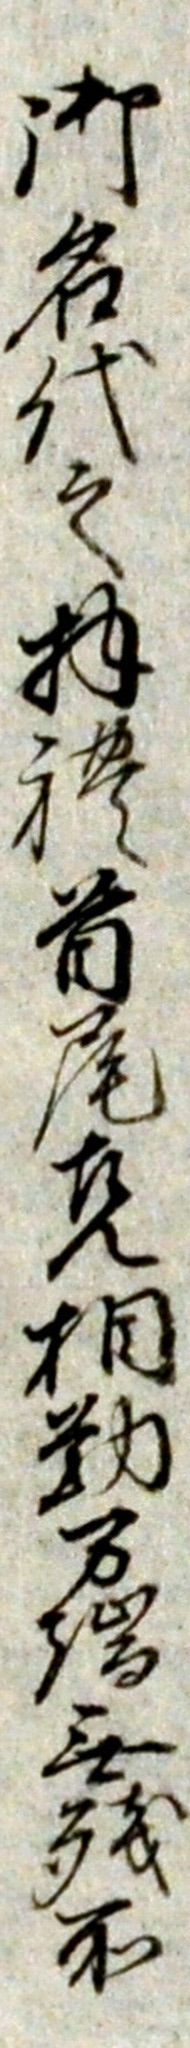御名代之拝礼首尾克相勤万端無残所
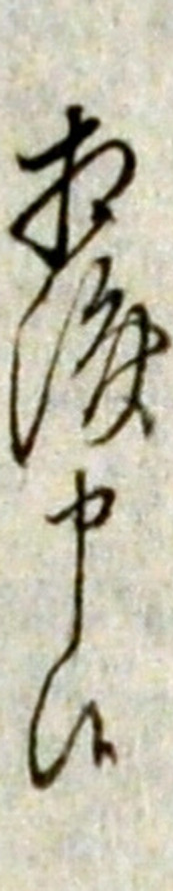相渡申候
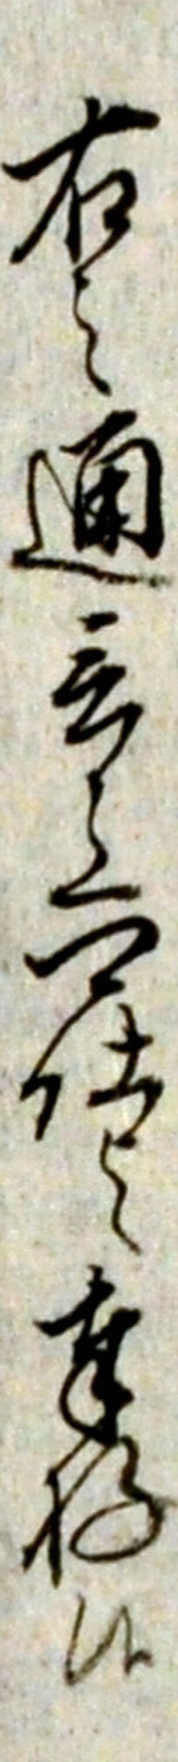右之通言上可仕と奉存候
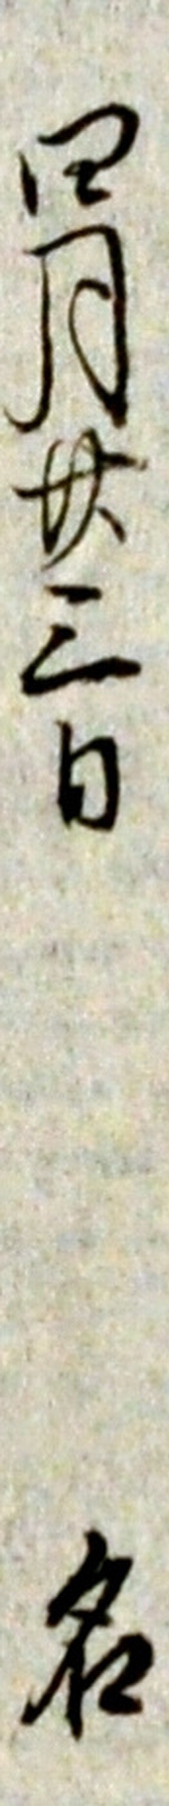四月廿三日名
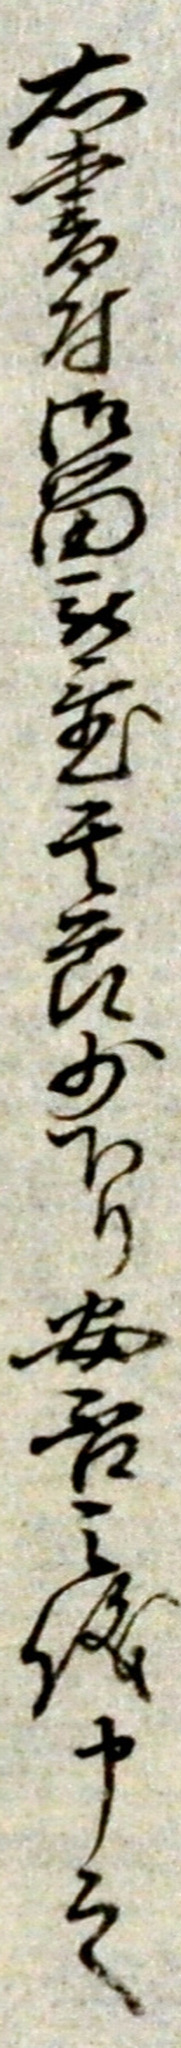右書付御留被置其節少下り安否之儀申之
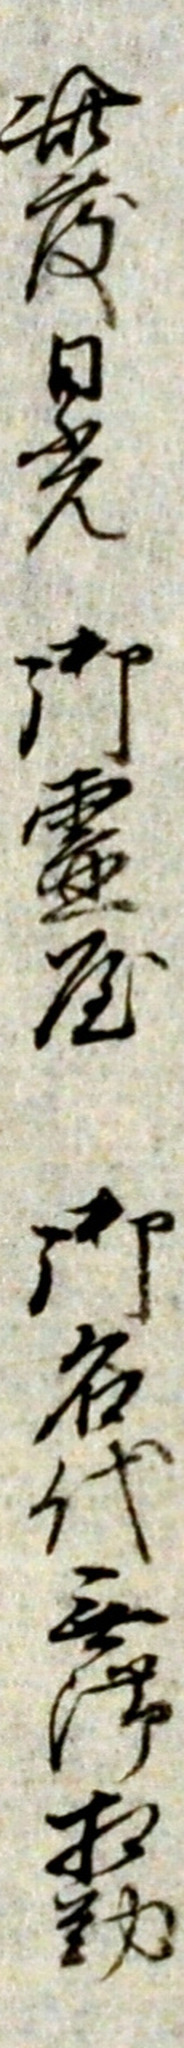此度日光御霊屋御名代無滞相勤
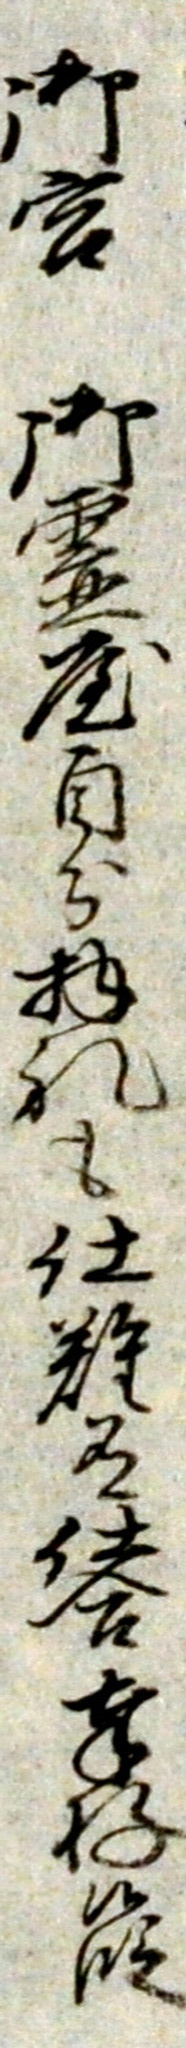御宮御霊屋自分拝礼も仕難有仕合奉存候段
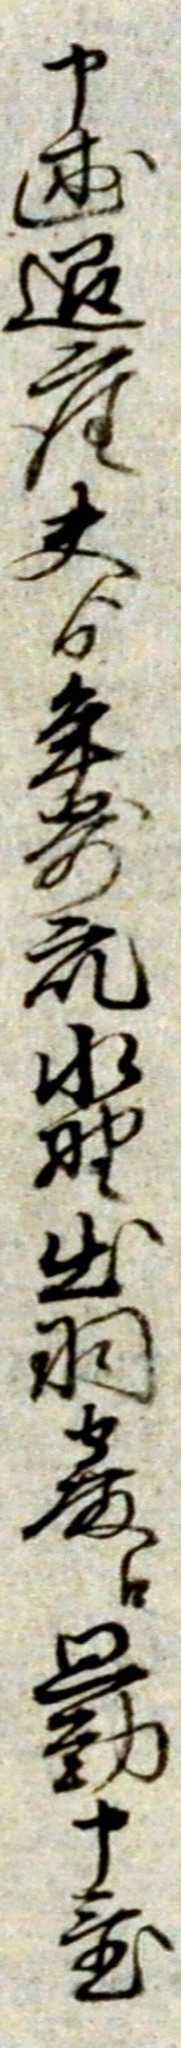申述退座夫ゟ年寄衆水野出羽守殿江廻勤申置
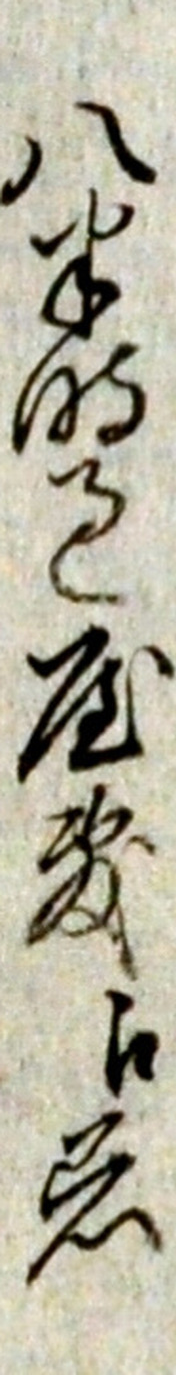八半時過屋敷江着
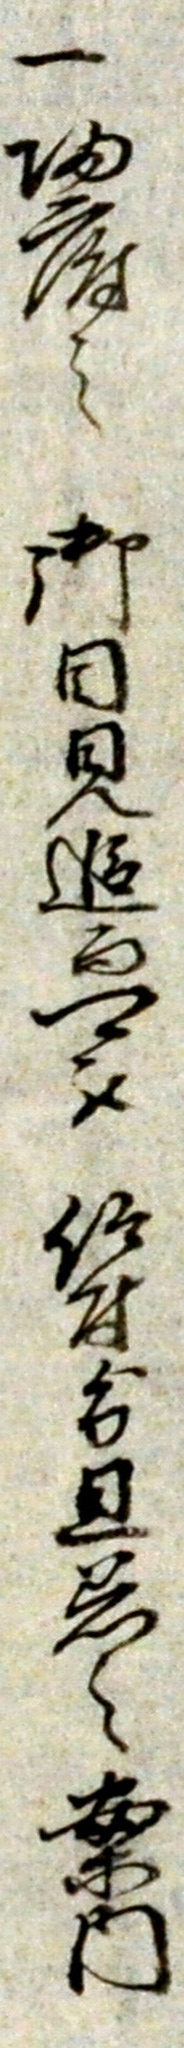一帰府之御目見追而可被仰付旨且着之案内
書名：日光御名代相勤候節ノ留
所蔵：伊那市立高遠町図書館・合同会社AMANE
